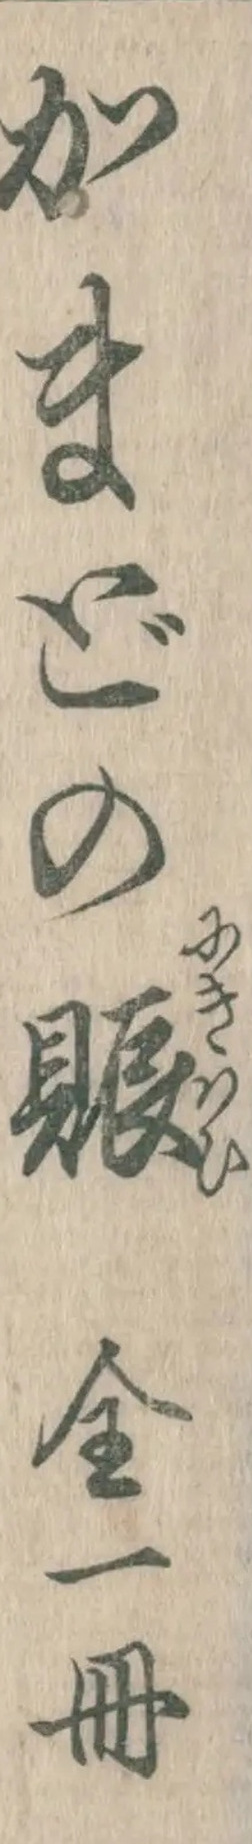かまどの賑全一冊
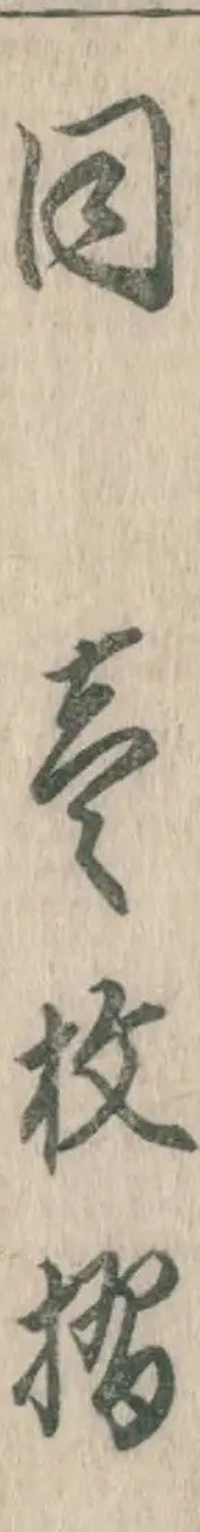同壱枚摺
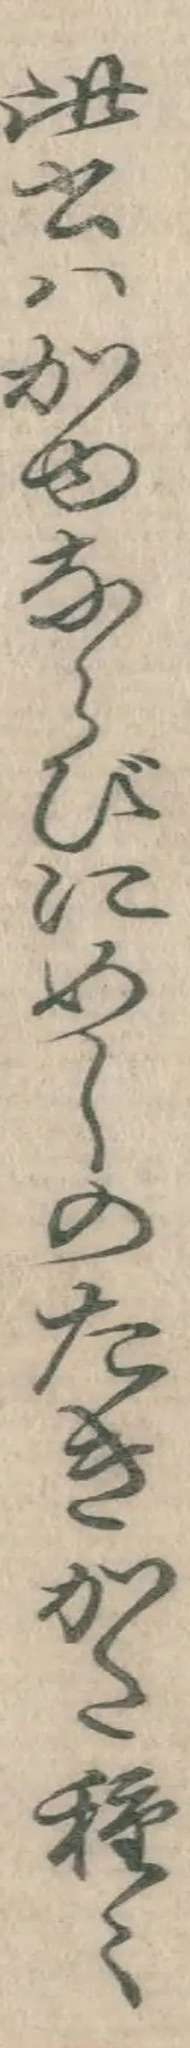此書はかゆならびにめしのたきかた種々
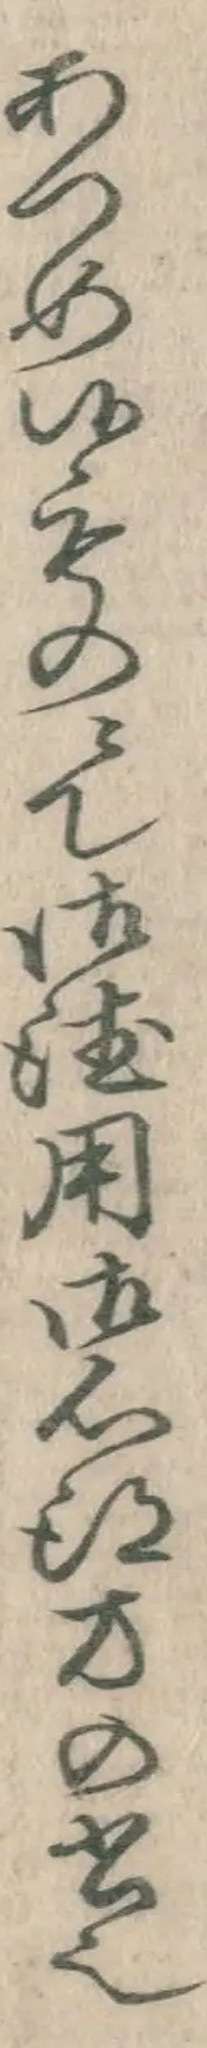あつめ候ものにて御徳用御心得方の書也
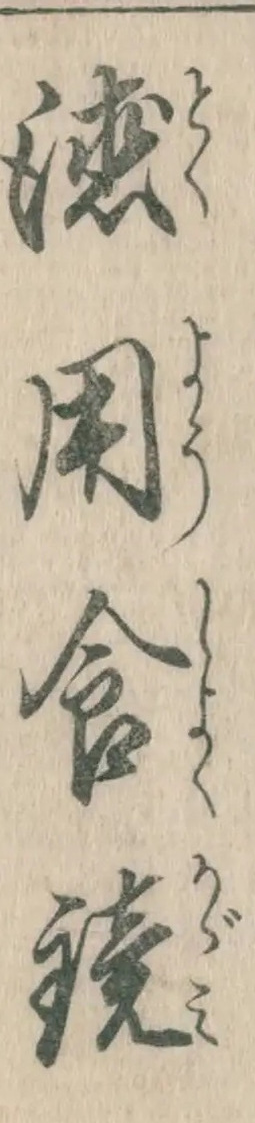徳用食鏡
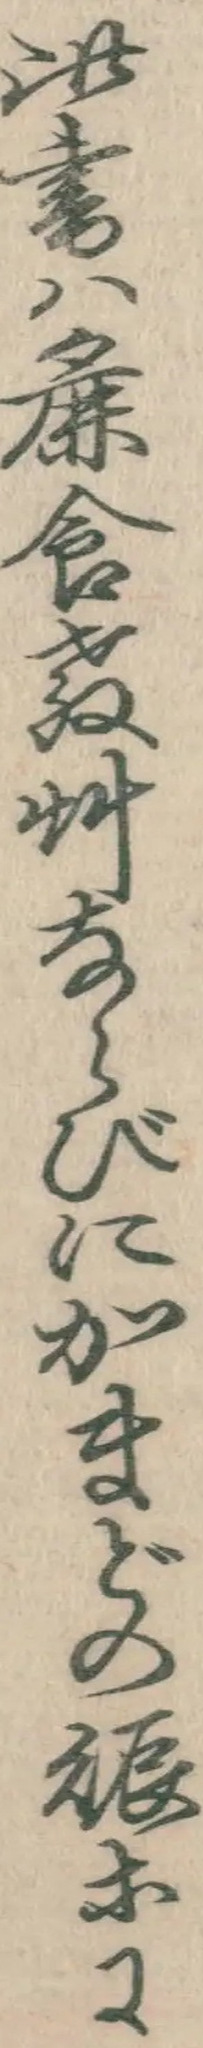此書は麁食教艸ならびにかまどの賑等に
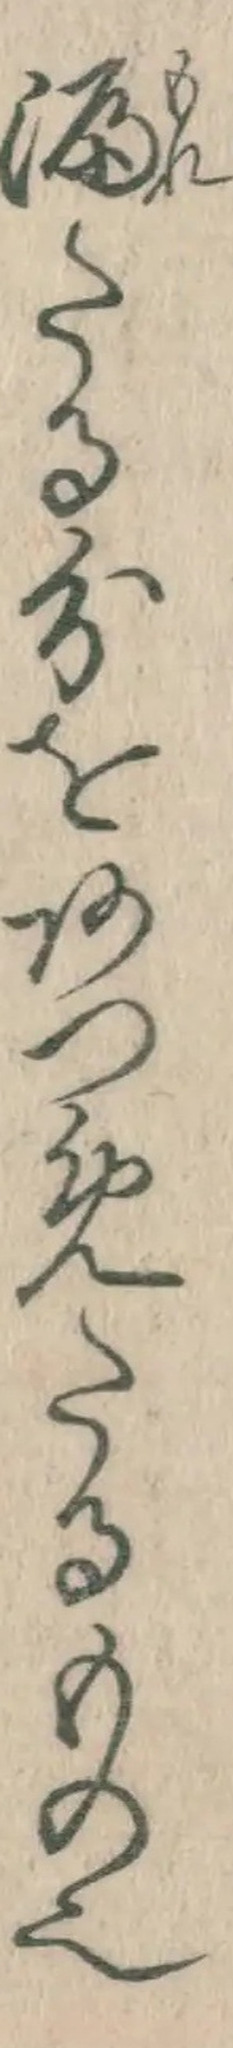漏たる分をあつめたるもの也
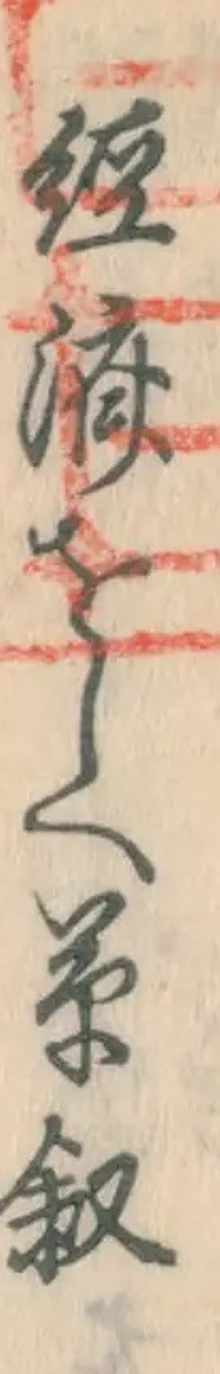経済をしへ草叙
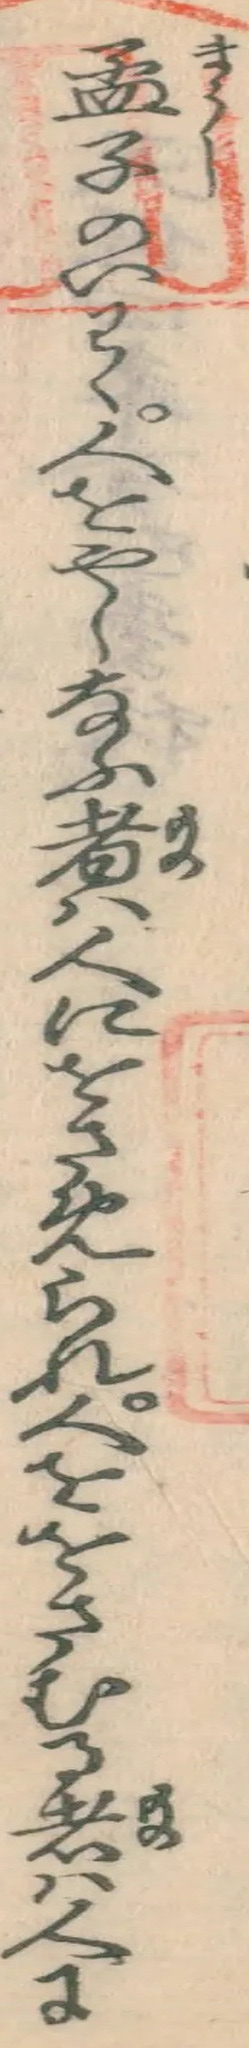孟子のいわく。人をやしなふ者は人にをさめられ。人ををさむる者は人に
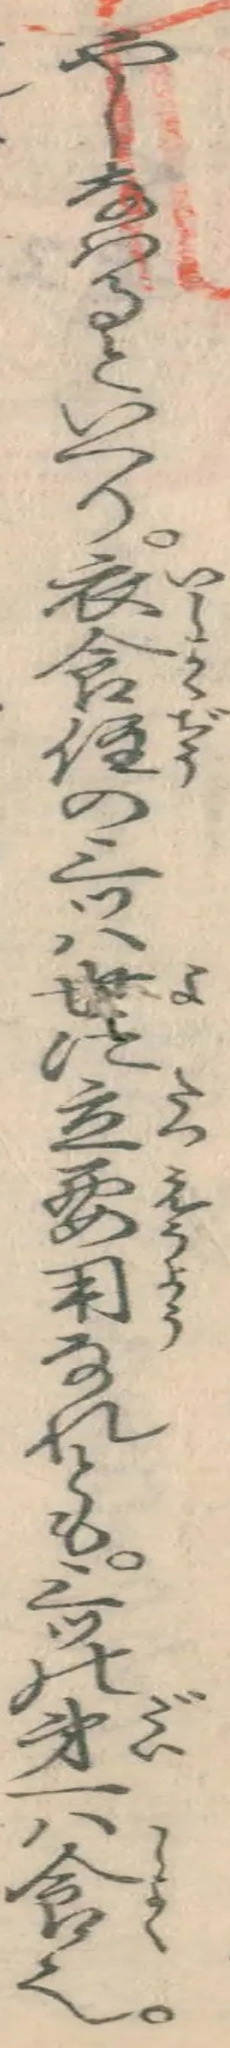やしなはるといへり。衣食住の三ッは世に立要用なれとも。三ッの第一は食也。
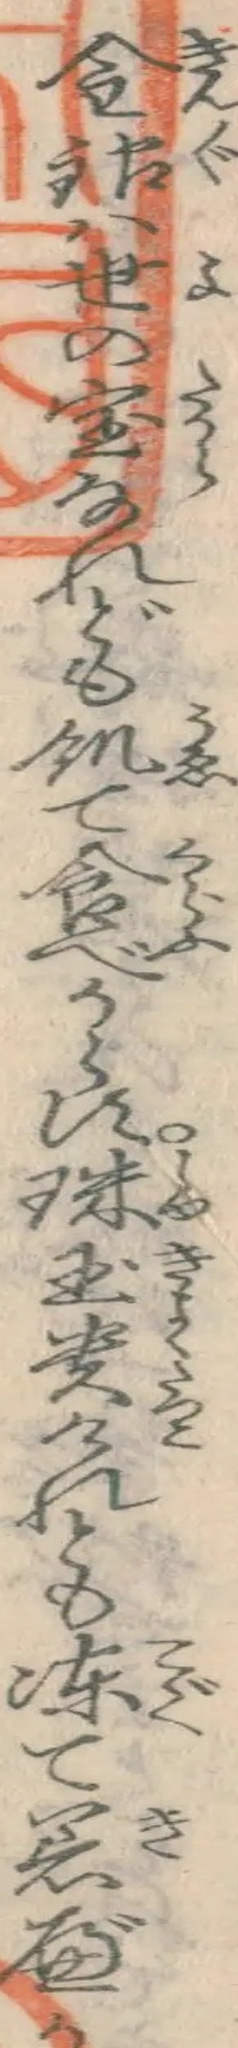金銀は世の宝なれども飢て食べからす。珠玉貴けれとも凍て着べからず。
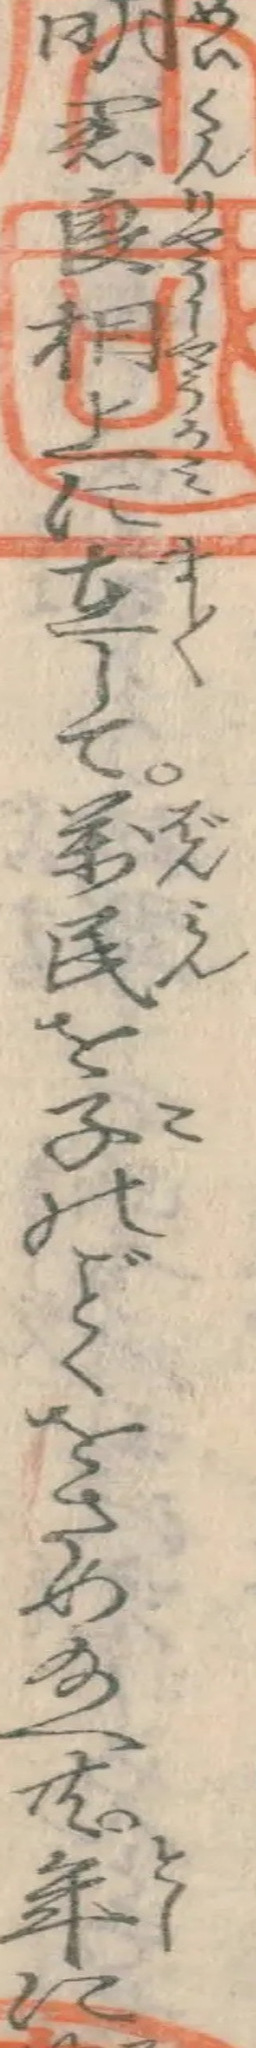明君良相上に在して。万民を子のごとくをさめ給へ共。年に豊凶あり
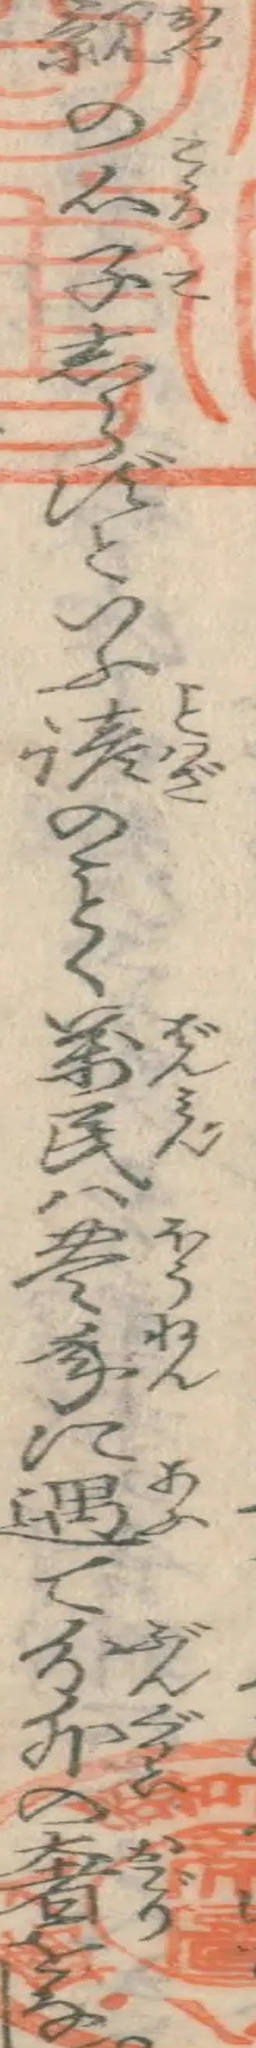親の心子しらずといふ諺のことく万民は豊年に遇て分外の奢をなし。
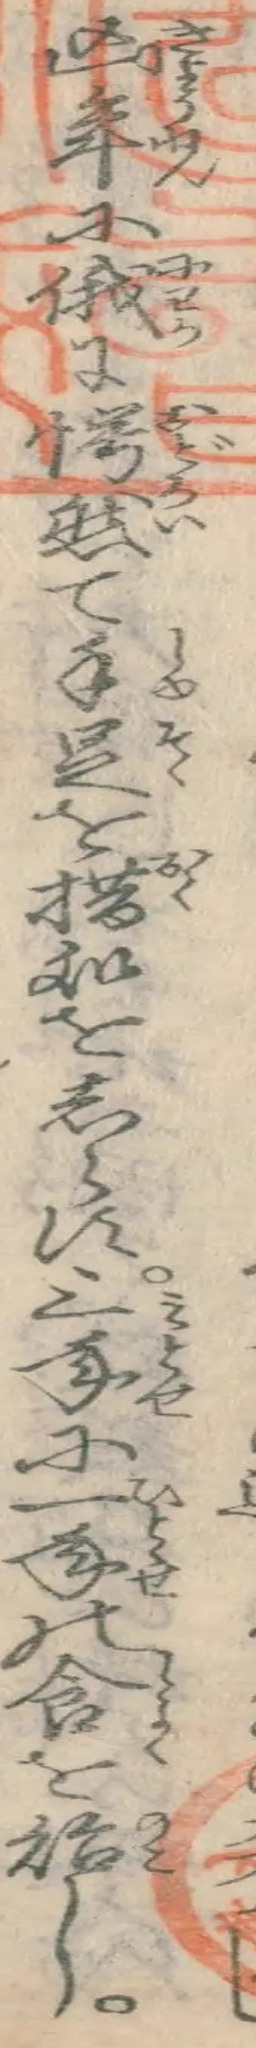凶年に俄に愕然て手足を措処をしらす。三年に一年の食を貽し。
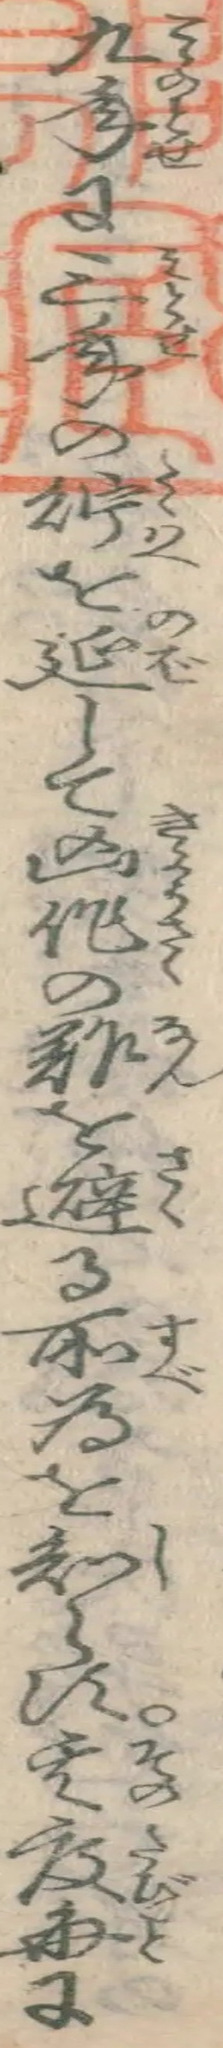九年に三年の貯を延して凶作の難を避る所為を知らす。其度毎に
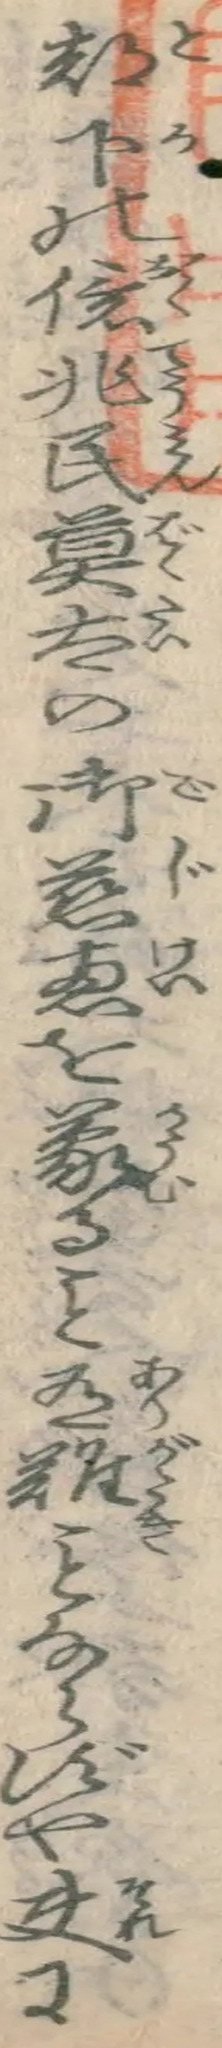都下の億兆民莫太の御慈恵を蒙ること有難ことならずや夫に
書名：経済をしへ草
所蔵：国立国会図書館 National Diet Library, JAPAN
